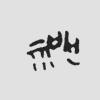神
